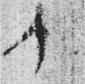人
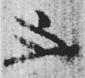之
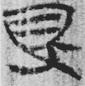○（得）
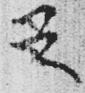邑
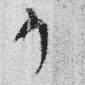人
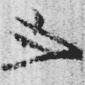之
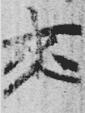○（災）
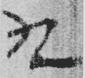九
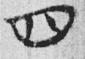四
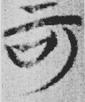可
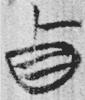貞
